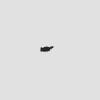一
